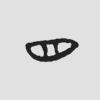四
